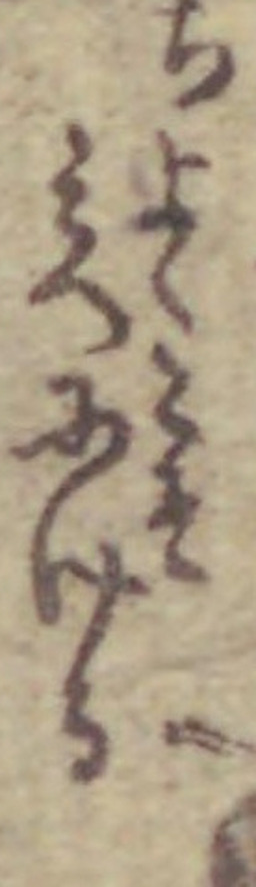みへにける
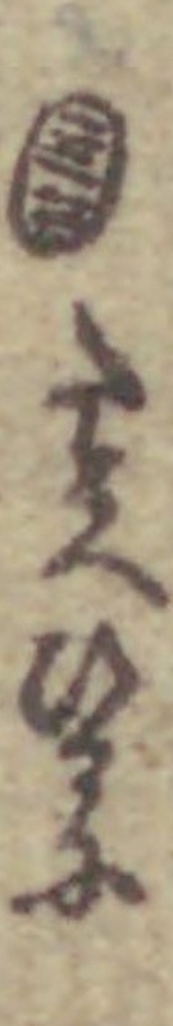たとへひるに
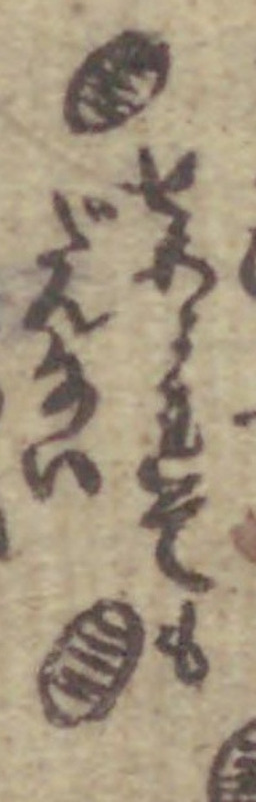だんない
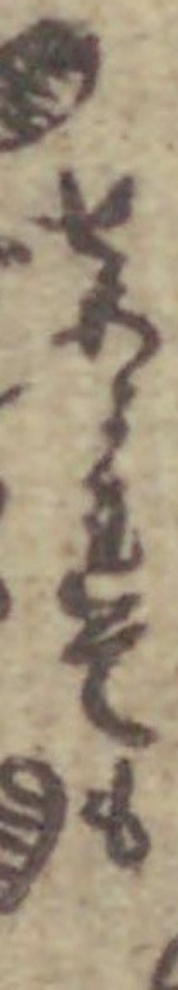せめられても
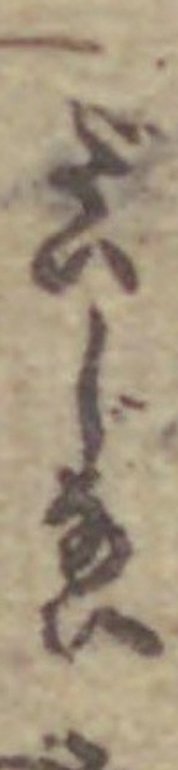だいじない
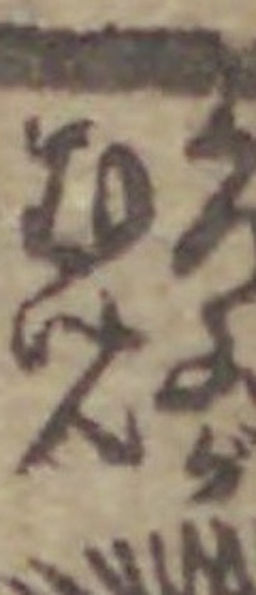むけん
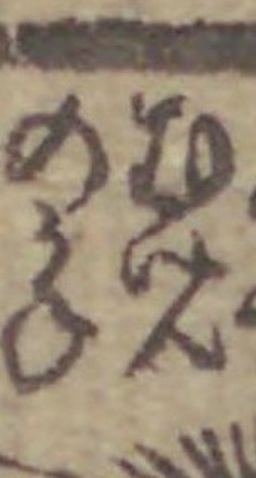のかね
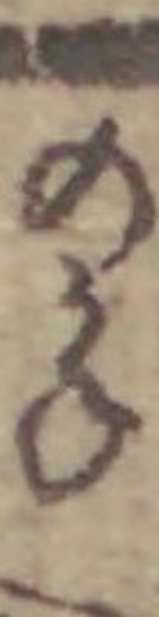のかね
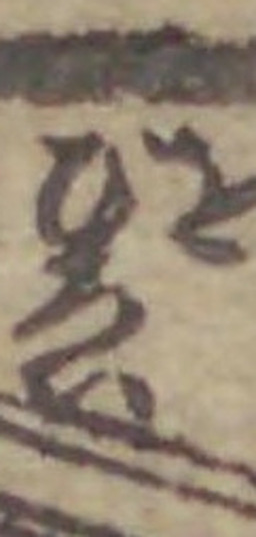ひろい
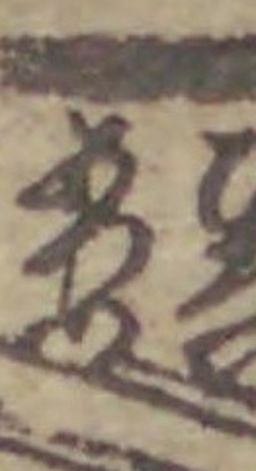あつめ
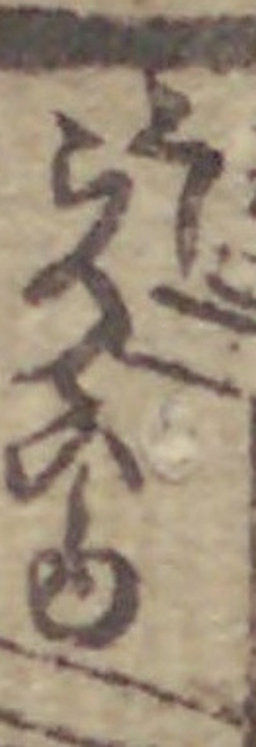らへていしゆ
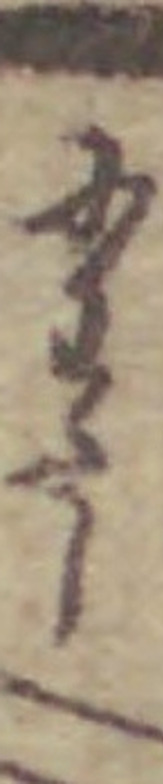にわたし
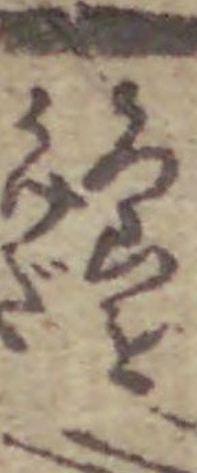うけだ
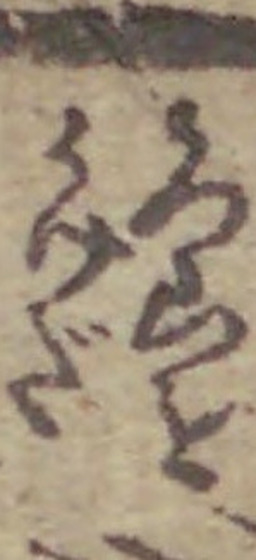うけだ
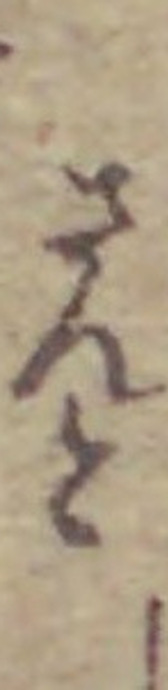さんと
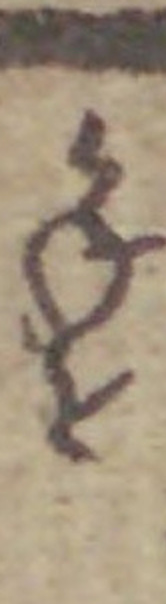かねを
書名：大通其面影 2巻
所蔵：国立国会図書館 National Diet Library, JAPAN
